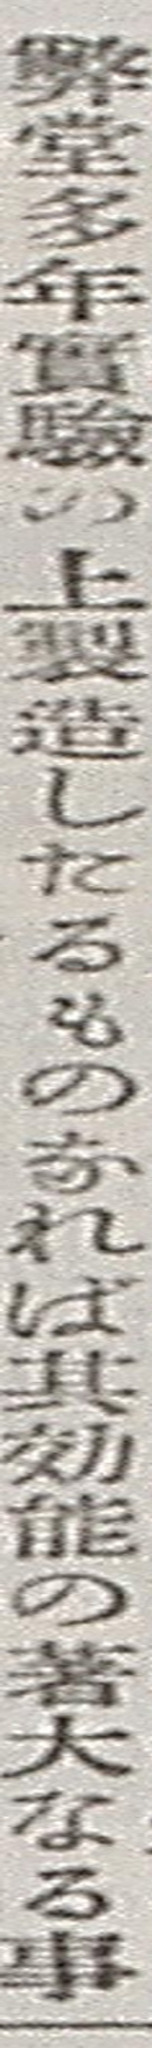弊堂多年実験の上製造したるものなれば其効能の著大なる事
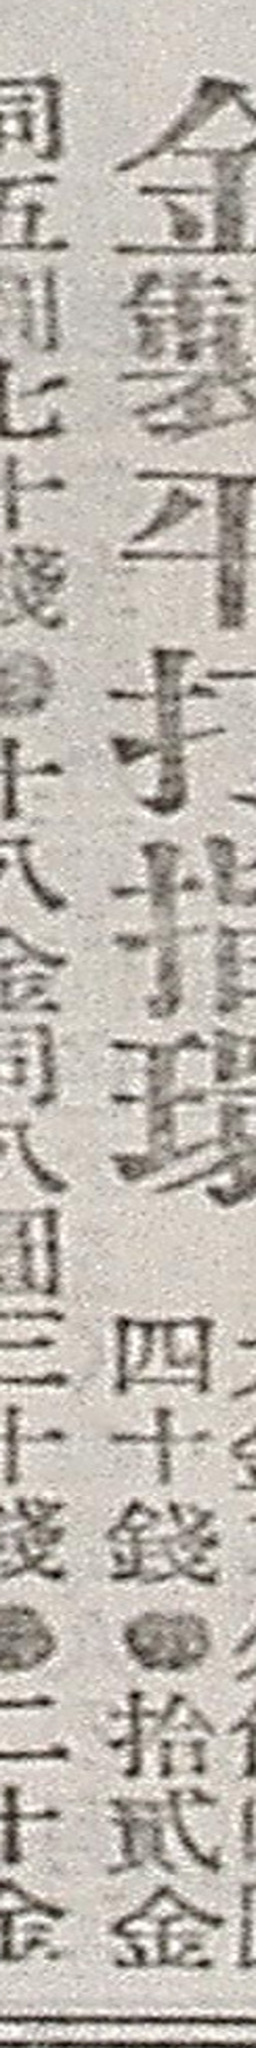同五円七十銭●十八金同八円三十銭●二十金
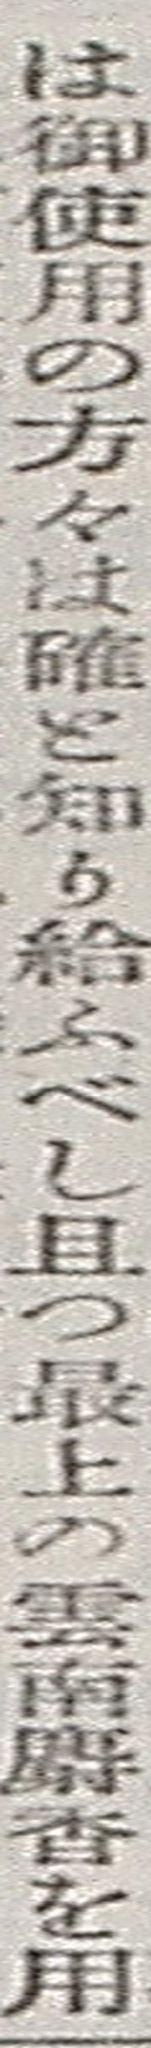は御使用の方々は確と知り給ふべし且つ最上の雲南麝香を用
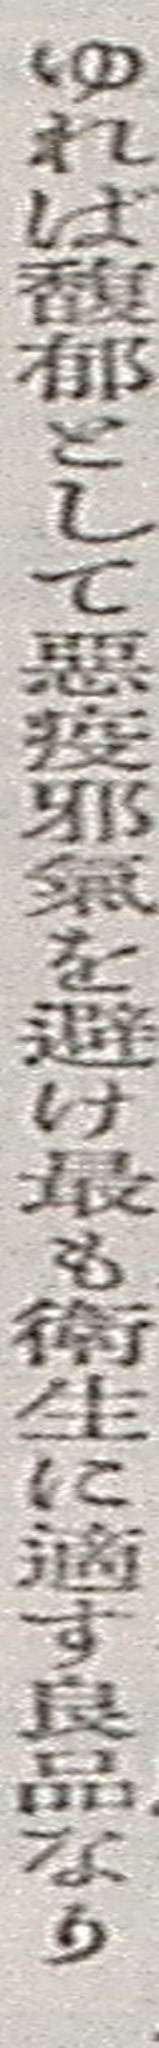ゆれば馥郁として悪疫邪気を避け最も衛生に適す良品なり
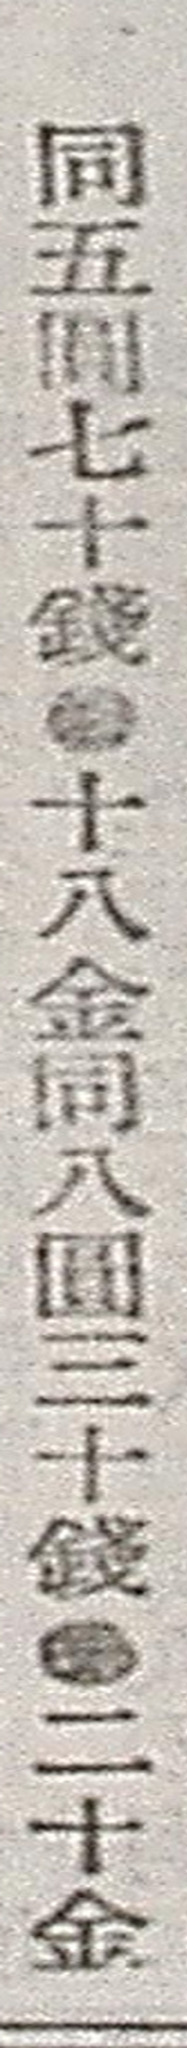同五円七十銭●十八金同八円三十銭●二十金
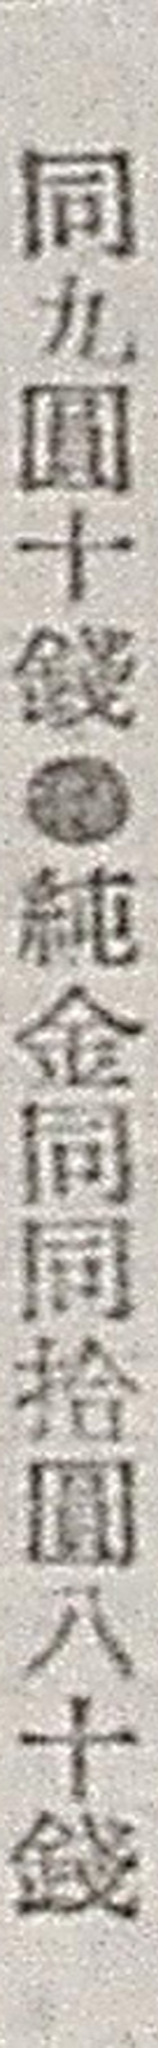同九円十銭●純金同同拾円八十銭
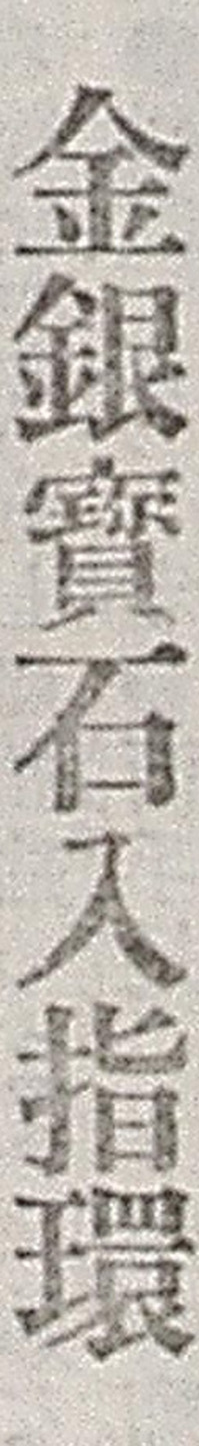金銀宝石入指環
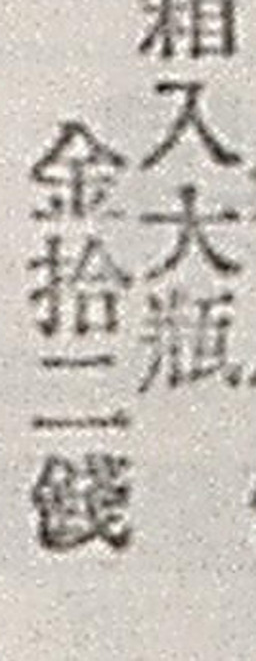金拾二銭
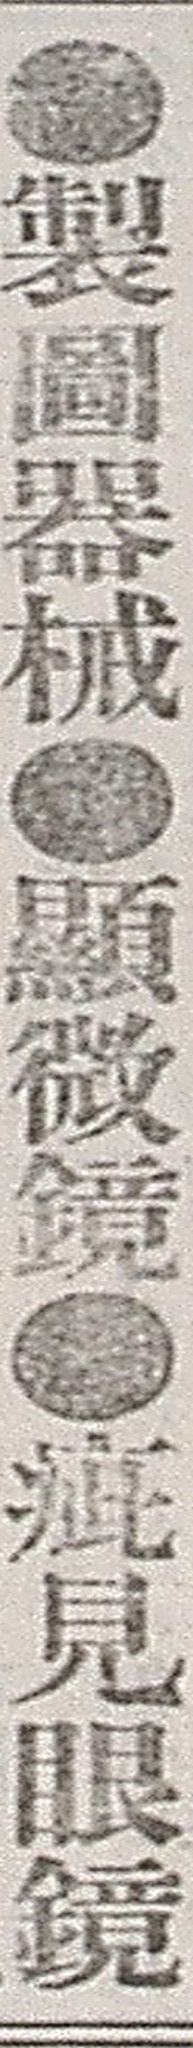●製図器械●顕微鏡●疵見眼鏡
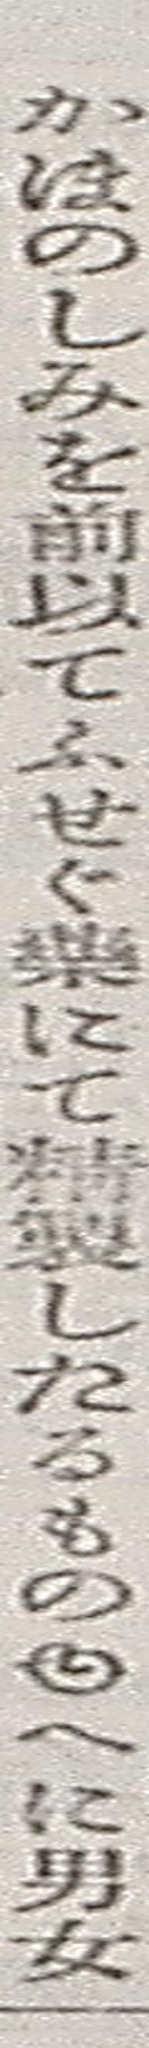かほのしみを前以てふせぐ薬にて精製したるものゆへに男女
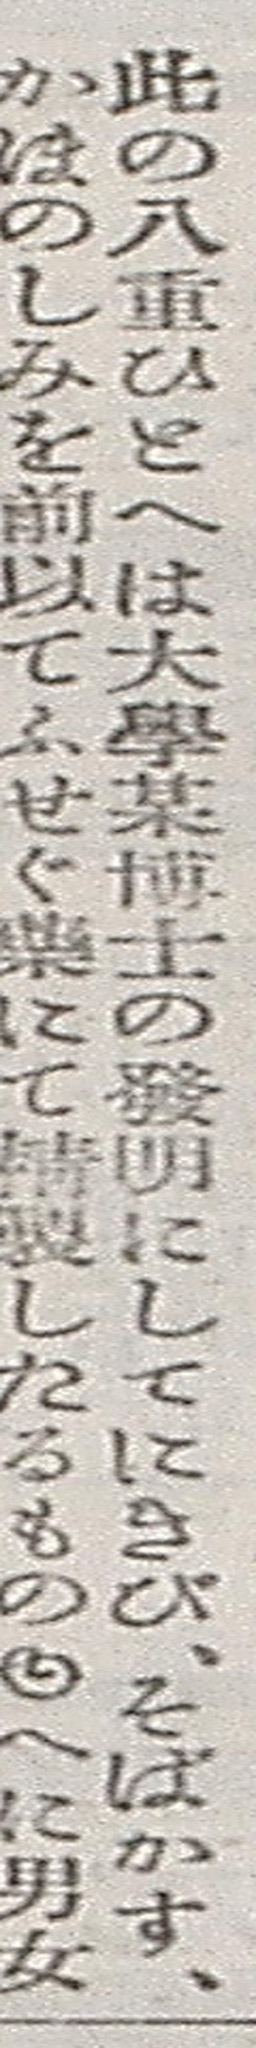かほのしみを前以てふせぐ薬にて精製したるものゆへに男女
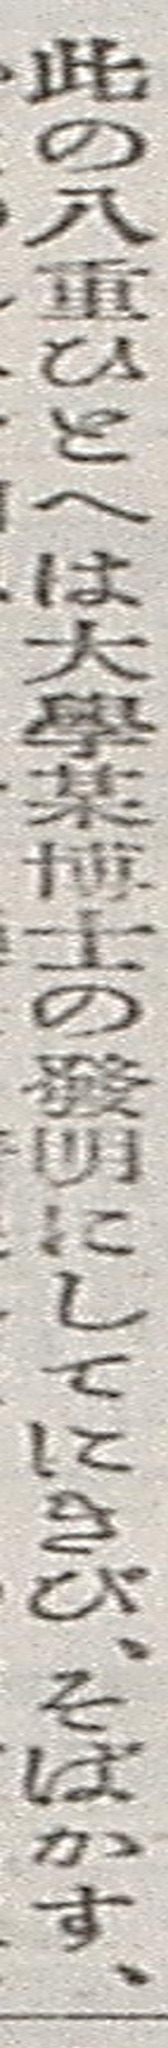此の八重ひとへは大学某博士の発明にしてにきび、そばかす、
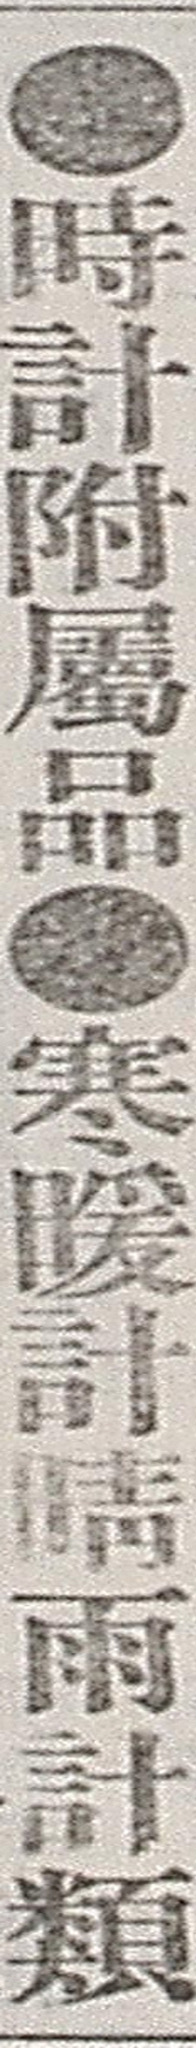●時計附属品●寒暖計晴雨計類
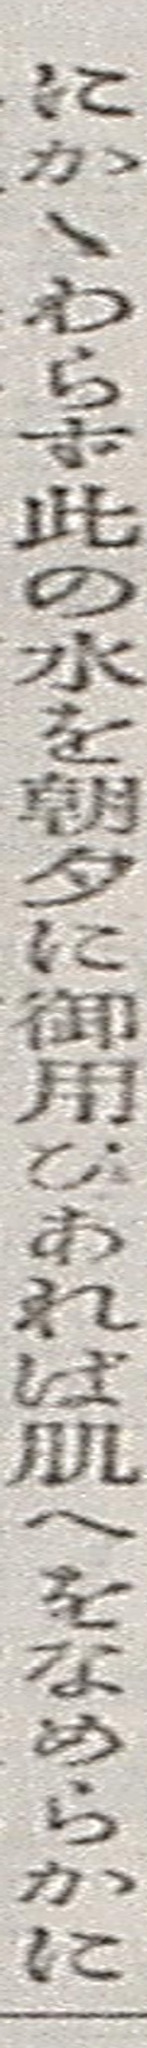にかゝわらず此の水を朝夕に御用ひあれば肌へをなめらかに
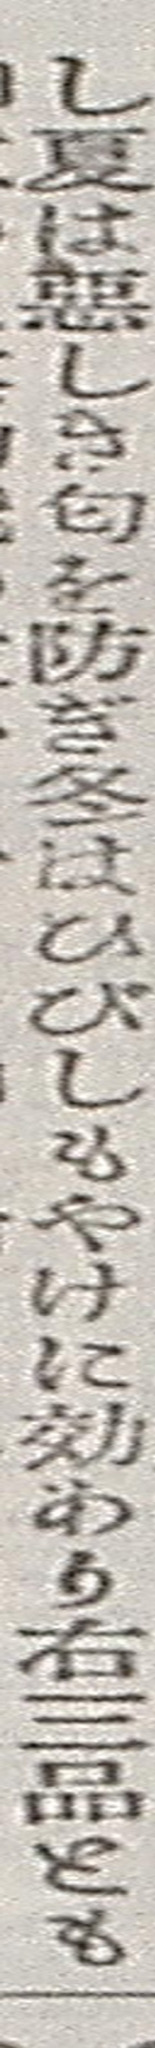し夏は悪しき匂を防ぎ冬はひびしもやけに効あり右三品とも
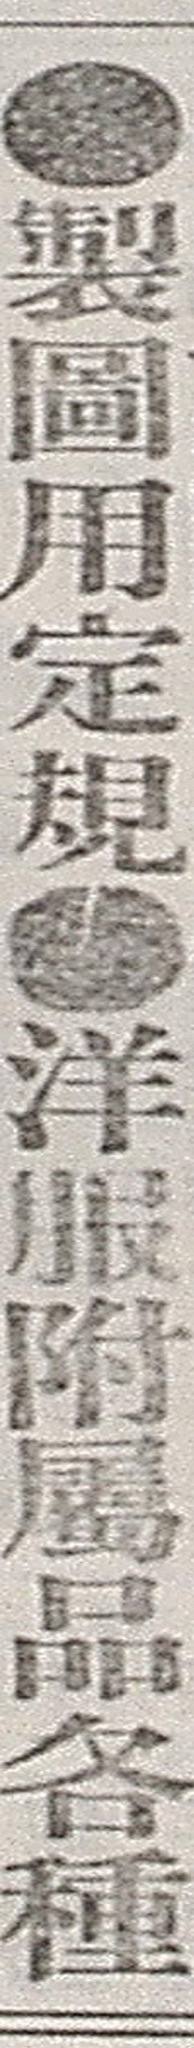●製図用定規●洋服附属品各種
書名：風俗畫報臨時増刊第百二十號　大海嘯被害録（下）
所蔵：東京大学地震研究所図書室 Earthquake Research Institute Library, The University of Tokyo, JAPAN
